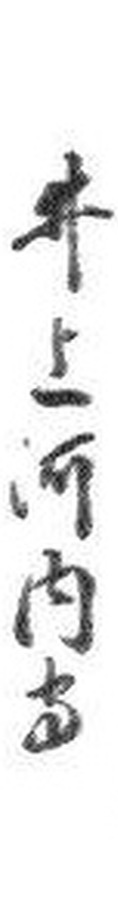井上河内守
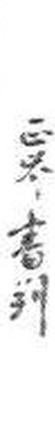正岑書判
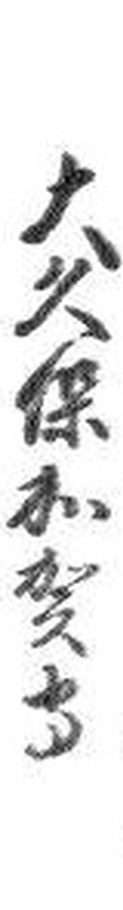大久保加賀守
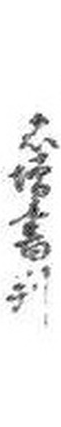忠増書判
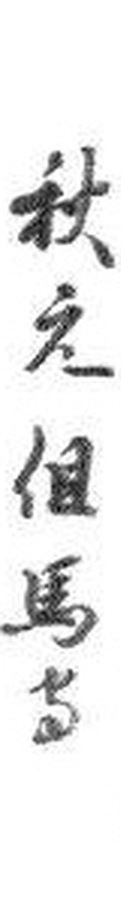秋元但馬守
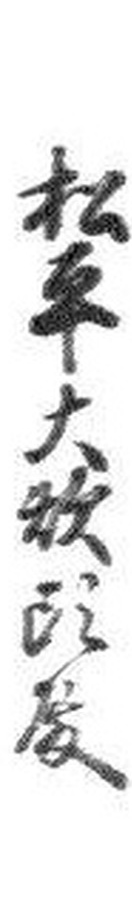松平大炊頭殿

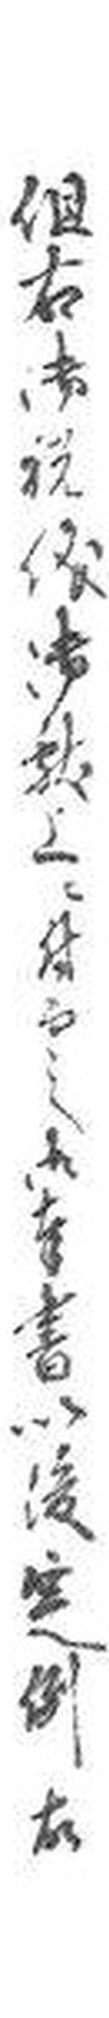但右御祝儀御献上ニ付而之御奉書以後定例故
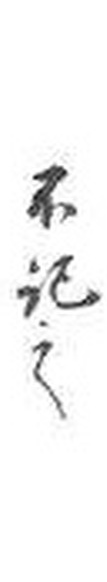不記之
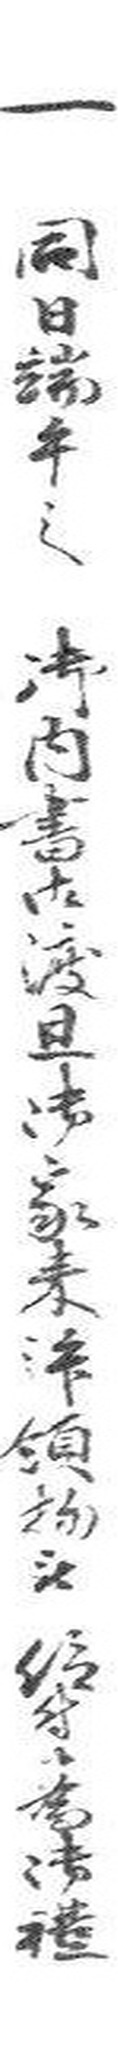一同日端午之御内書御渡且御家来拝領物被仰付候為御礼
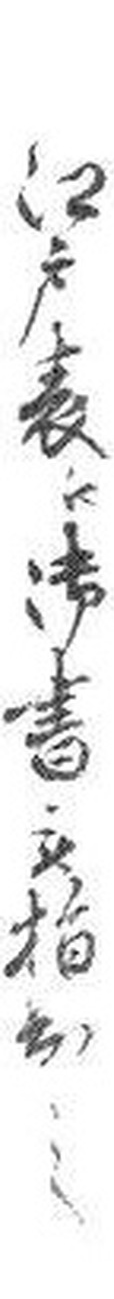江戸表江御書被指出之
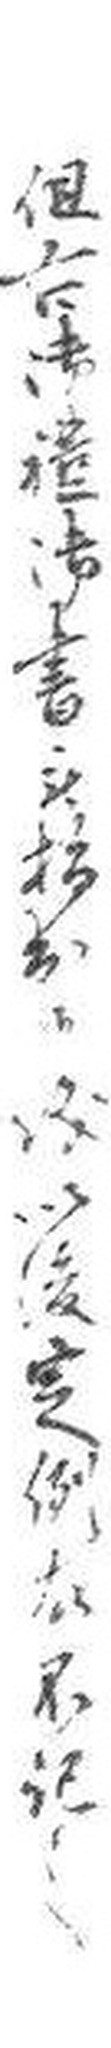但右御礼御書被指出候儀以後定例故不記之
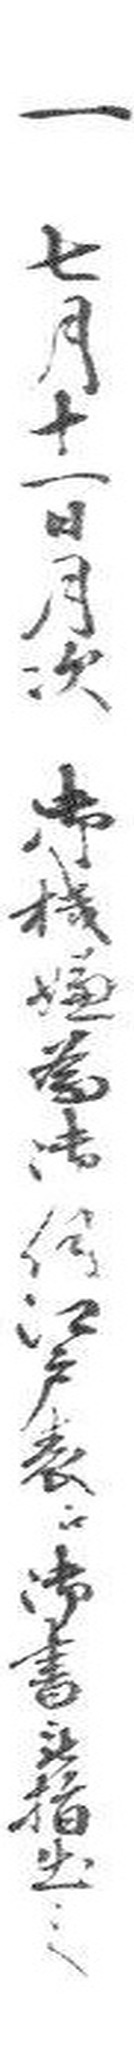一七月十一日月次御機嫌為御伺江戸表江御書被指出之
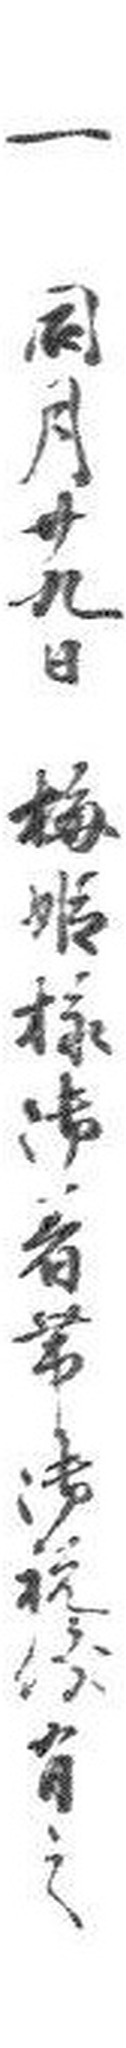一同月廿九日梅姫様御着帯御祝儀有之
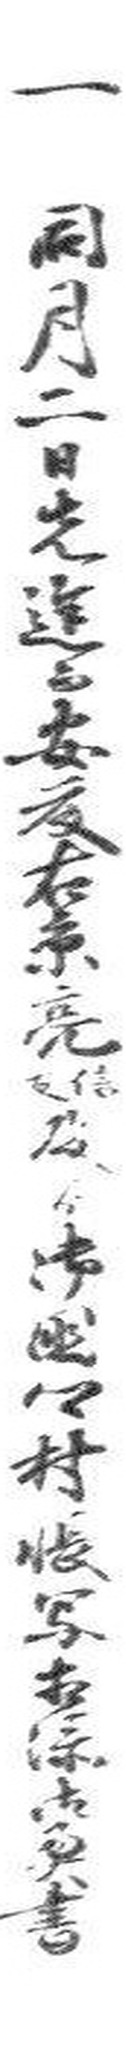一同月二日先達而安藤右京亮信友殿ゟ御国郷村帳写相添御奥書
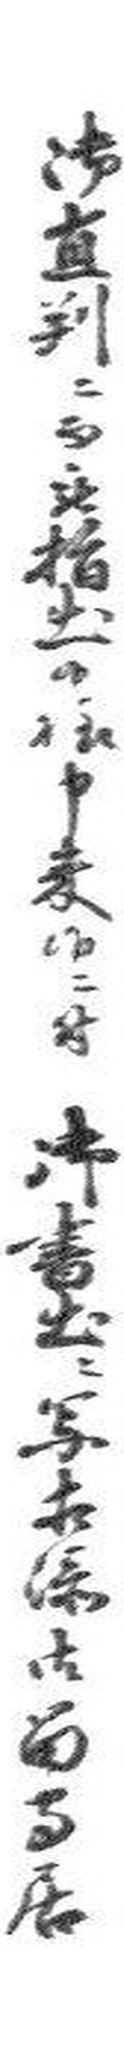御直判ニ而被指出候様申来候ニ付御書出ニ写相添御留守居
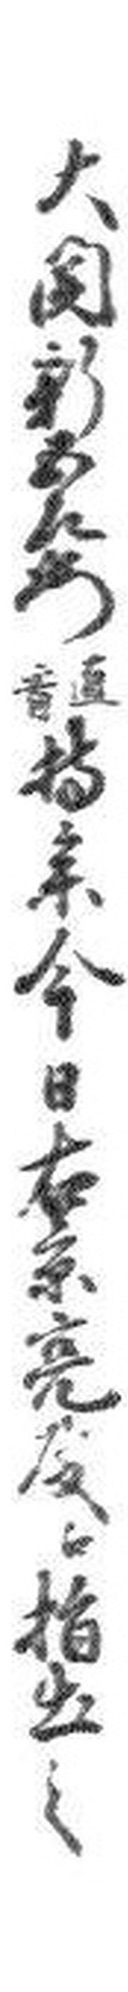大関新五左衛門直看持参今日右京亮殿江指出之
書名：家譜 二十八 吉邦公 従宝永七年七月五日到正徳元年十二月
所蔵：福井県文書館 Fukui Prefectural Archives
